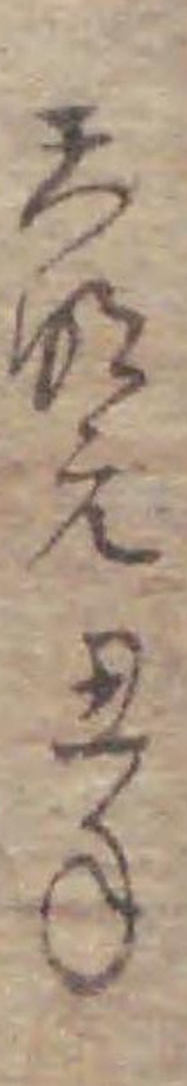天明元丑年
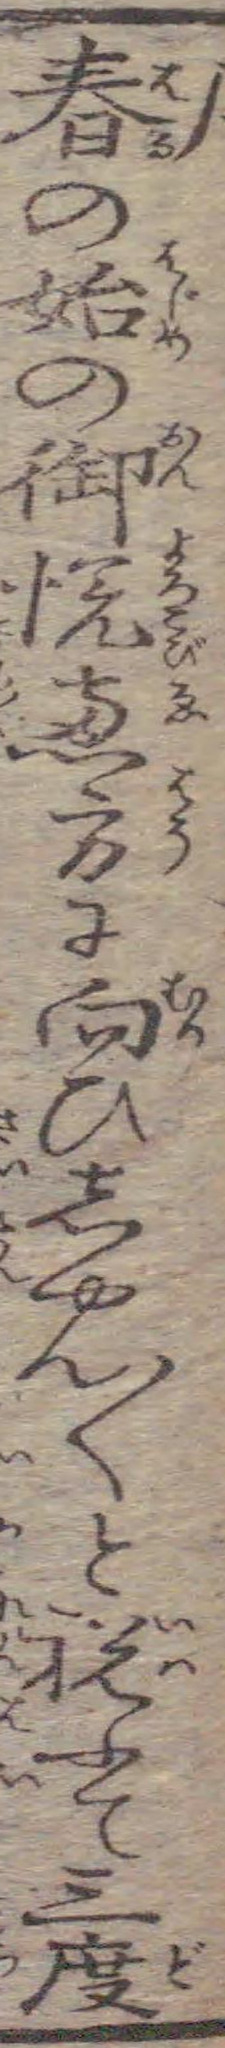春の始の御悦恵方に向ひしやん〳〵と祝ふて三度
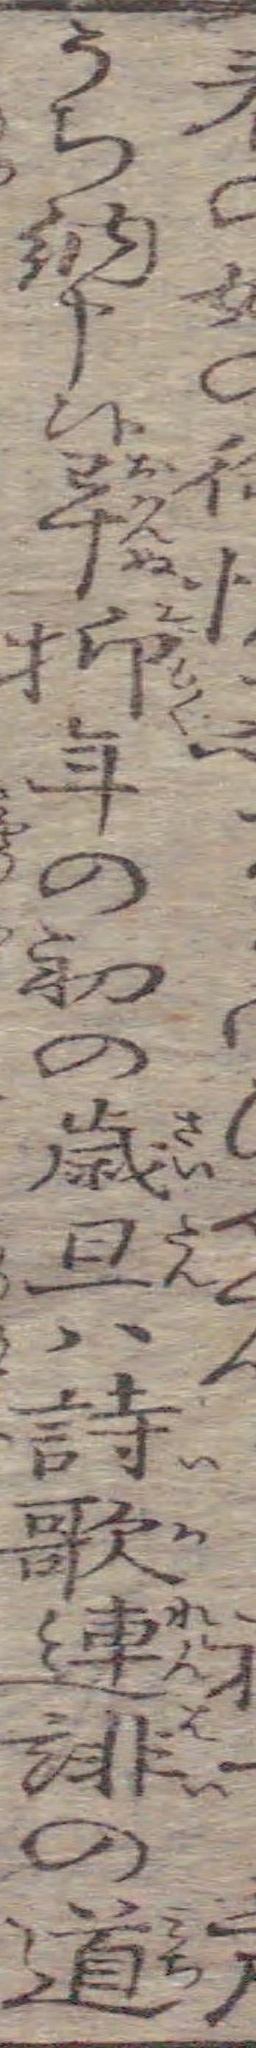うち納申候畢抑年の初の歳旦は詩歌連誹の道
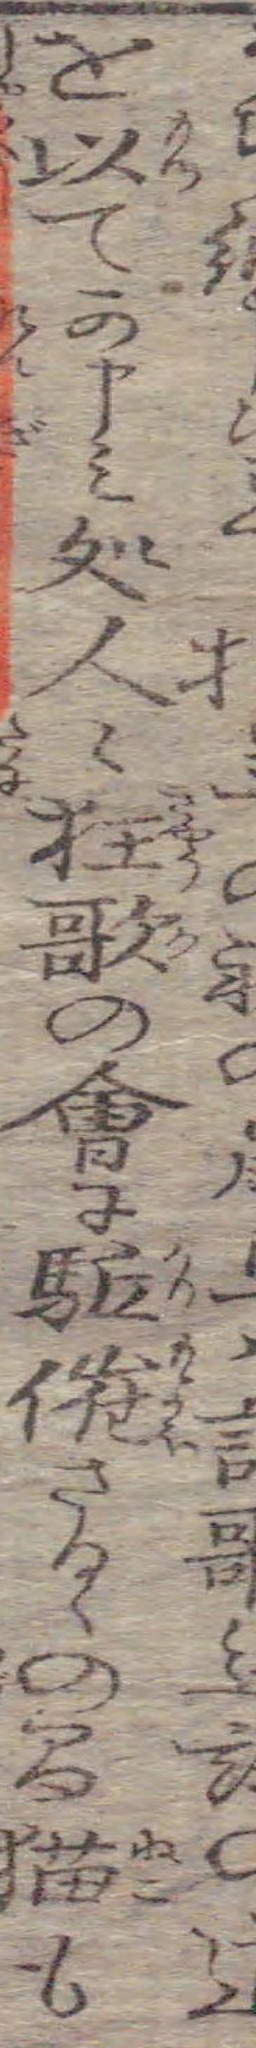を以て可申之処人々狂歌の会に駆催さるゝの間猫も
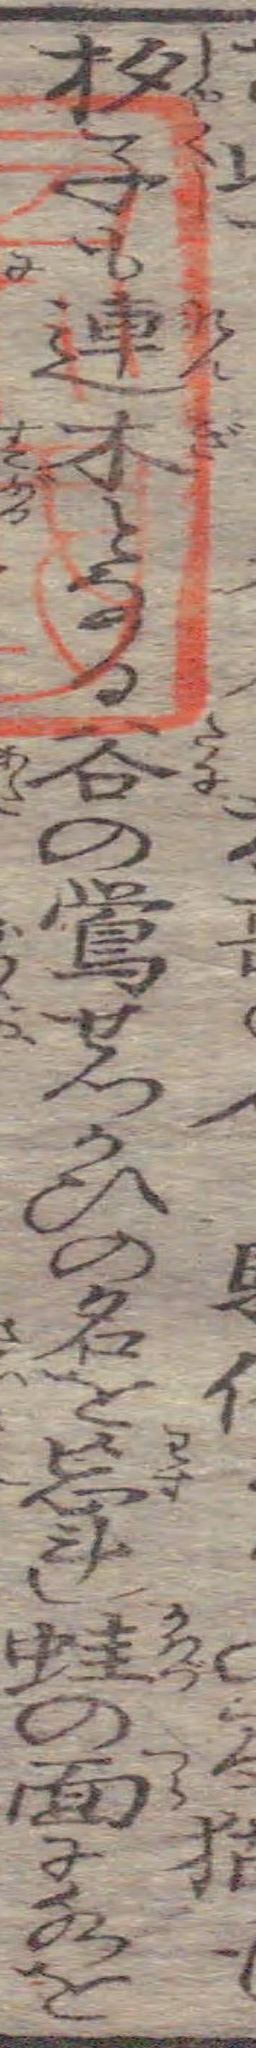杓子も連木となる谷の鴬せつかひの名を忘れ蛙の面に水を
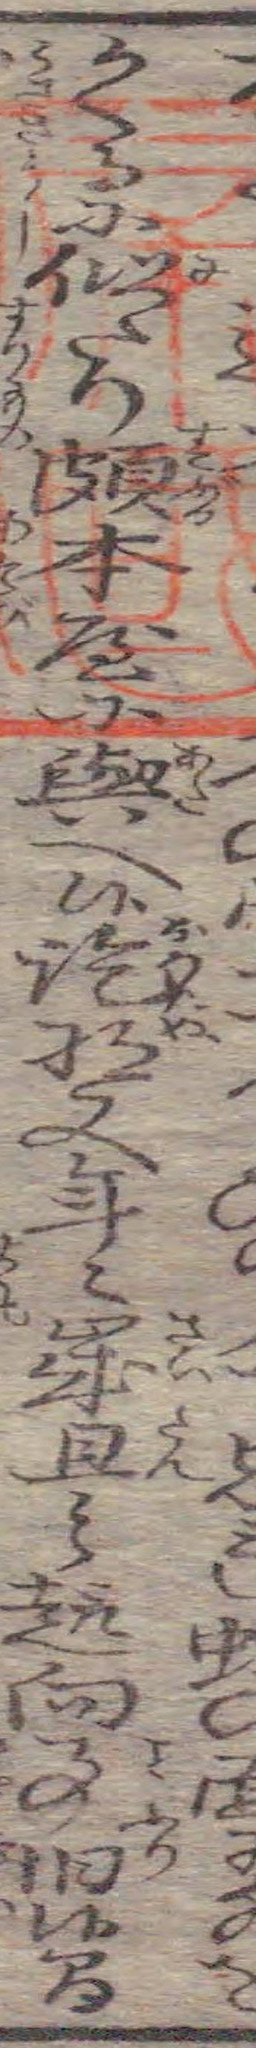かくるに似たり頗本屋に与へ候訖将又年々歳旦之趣向事旧候間
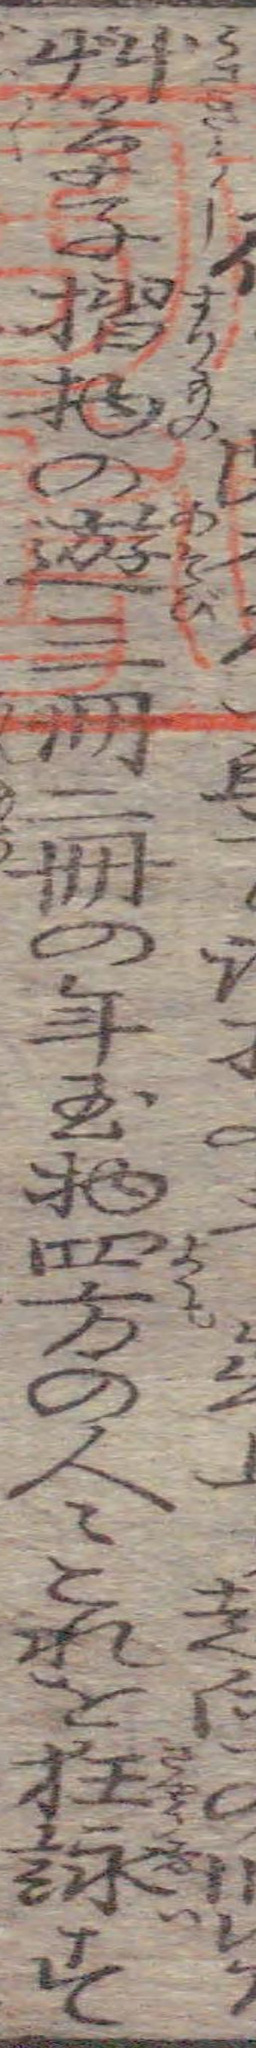艸草子摺物の遊三冊二冊の年玉物四方の人々これを狂詠す
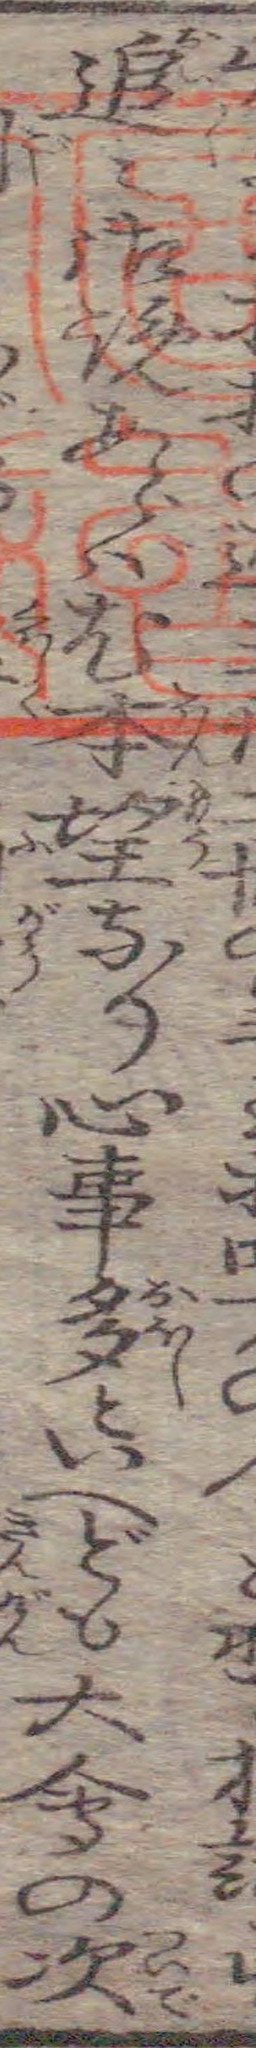追々御覧あらば尤本望なり心事多といへども大会の次
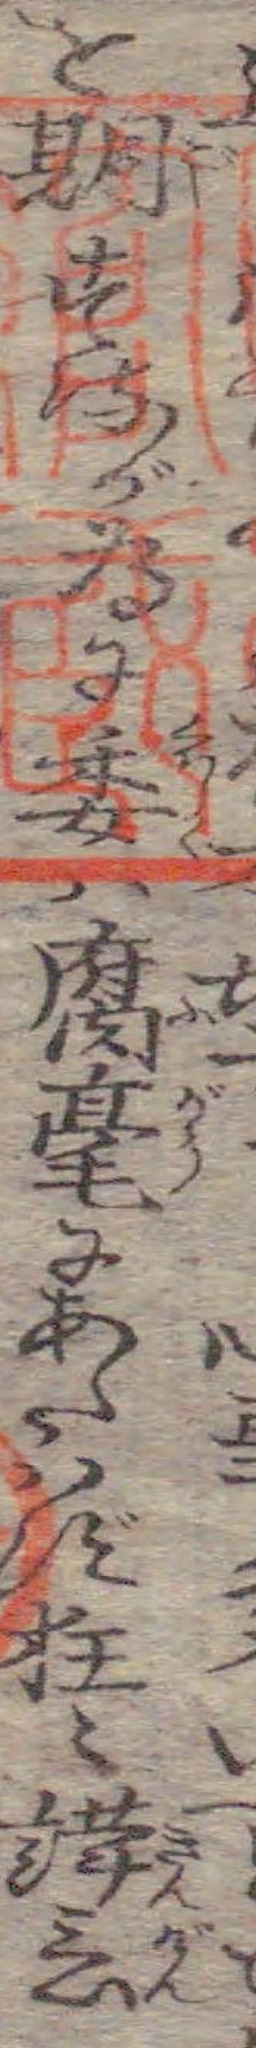を期するが為に委は腐毫にあたはず狂々謹言
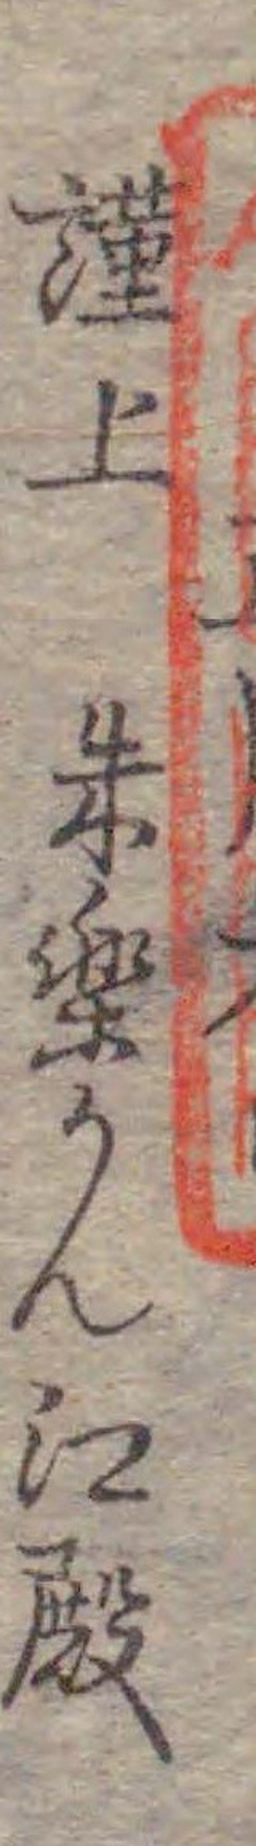謹上朱楽かん江殿
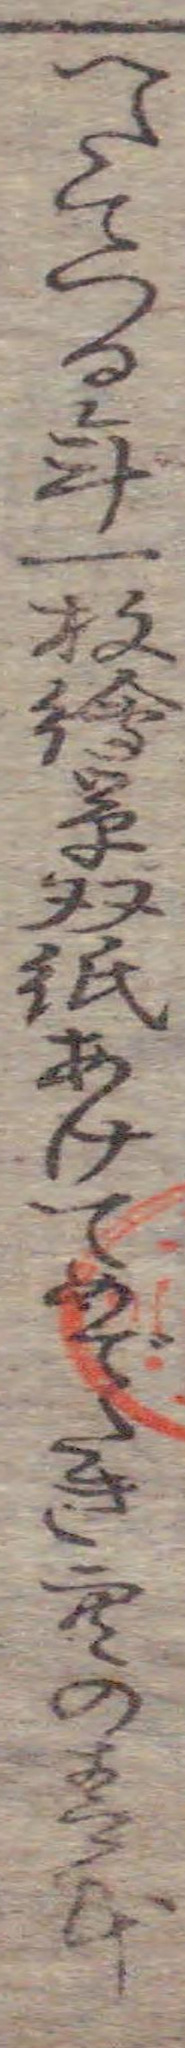へたてつる年一枚絵草双紙あけてめでたき空の青本
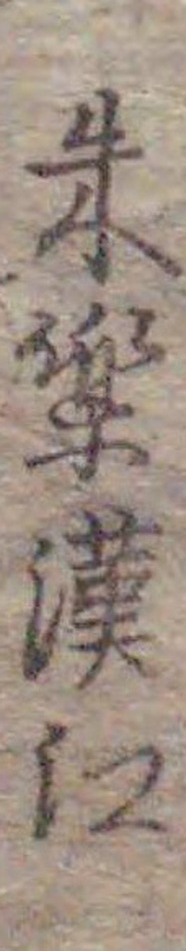朱楽漢江
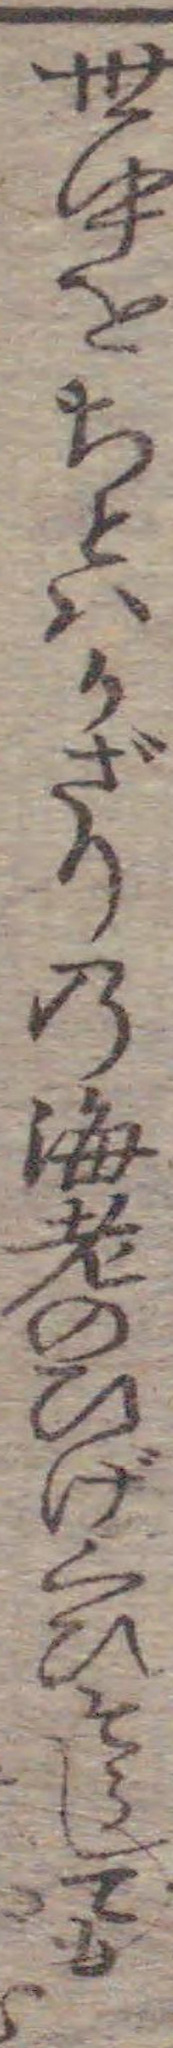世中をちとはかざりの海老のひげくひそうしても
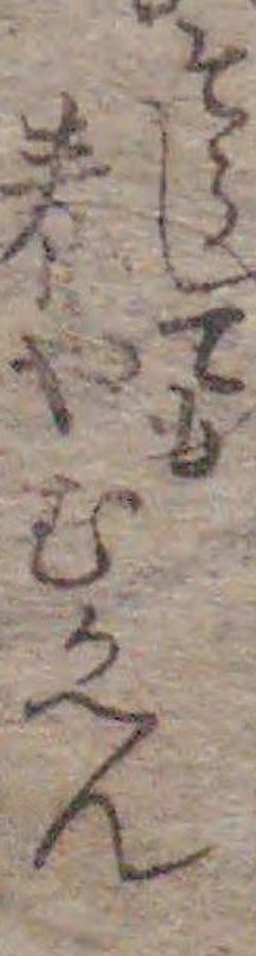春やむかへん

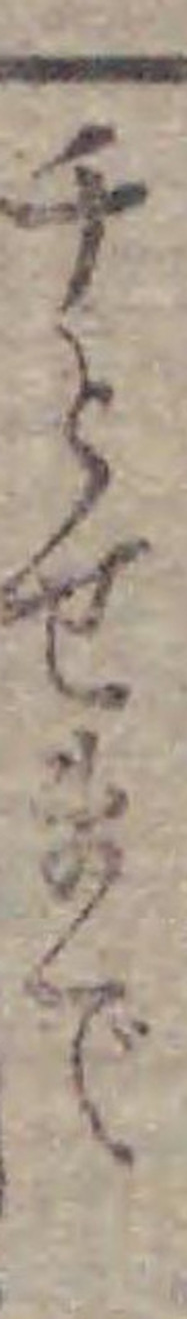千とせまで
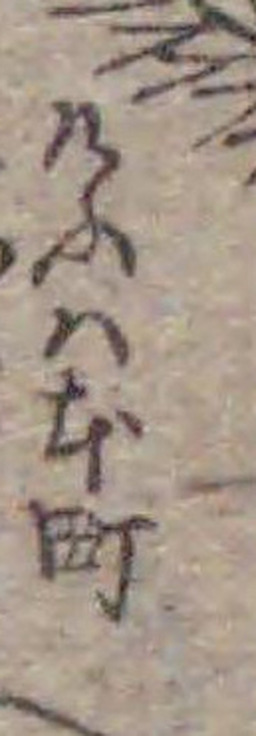けふは本町
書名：年始御礼帳 : 3巻
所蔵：国立国会図書館 National Diet Library, JAPAN
